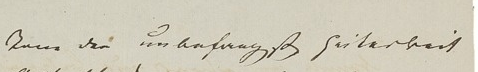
Tone der unbefangensten Heiterkeit
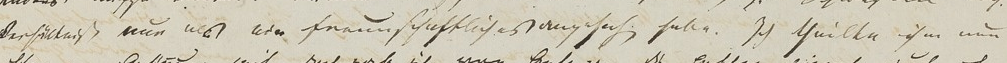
Verhältniß nur als ein freunschaftliches angesehen habe. Ich theilte ihm nun
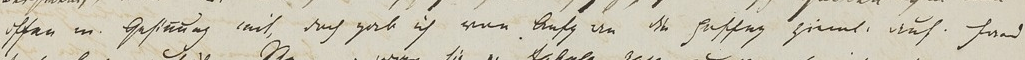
offen m. Gesinnung mit, doch gab ich von Anfg an die Hoffng zieml. auf. Fand
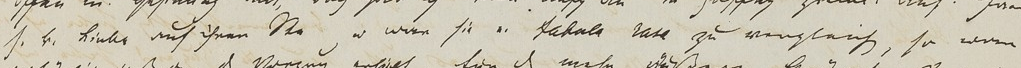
s. k. Liebe auf ihrer Ste u war sie e. tabula rasa zu vergleichen, so war
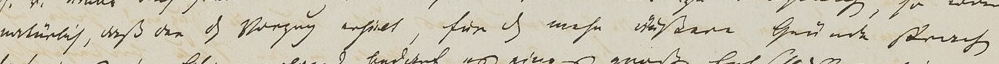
natürlich, daß der den Vorzug erhielt, für den mehr äußere Gründe sprachen.
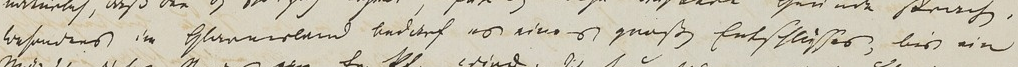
Besonders im Glarnerland bedarf es eines großen Entschlusses, bis ein
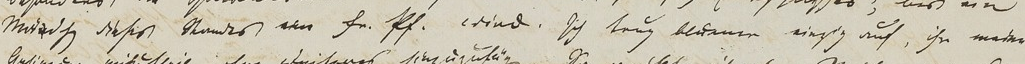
Mädchen dieses Standes eine Fr. Pf. wird. Ich trug Blumer einzig auf, ihr meine
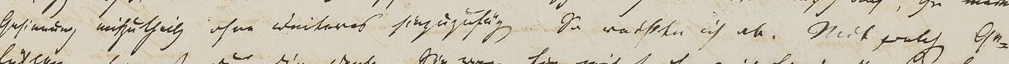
Gesinnung mitzutheilen ohne weiteres hinzuzufügen. So reiste ich ab. Mit welchen Ge-
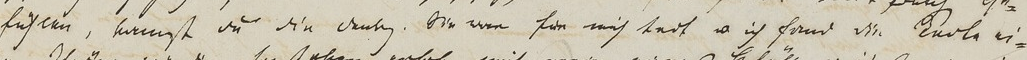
fühlen, kannst du dir denken. Sie war für mich todt u ich fand die Knote ei-
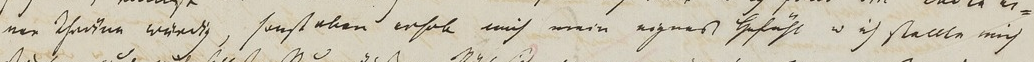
ner Thräne würdig, sonst aber erhob mich mein eignes Gefühl u ich stellte mich
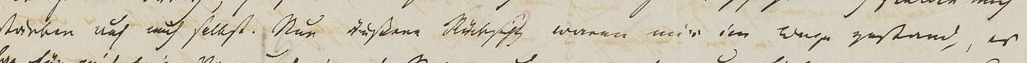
stärker auf mich selbst. Nur äußere Rücksichten waren mir im Wege gestanden, es
